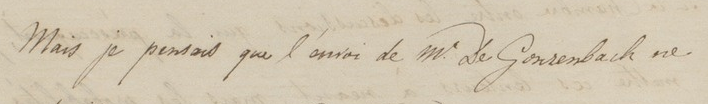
Mai je pensais que l'envoi de Mrde Gonzenbach ne
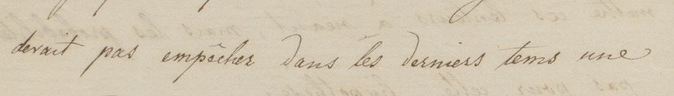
devait pas empêcher dans les derniers temps une
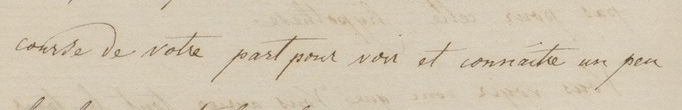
course de votre part pour voir et connaître un peu
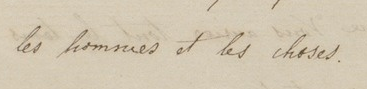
les hommes et les choses.
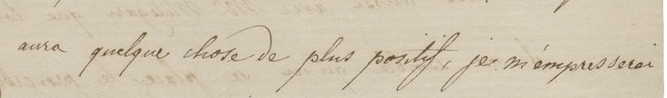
aura quelque chose de plus positif, je m'empresserai
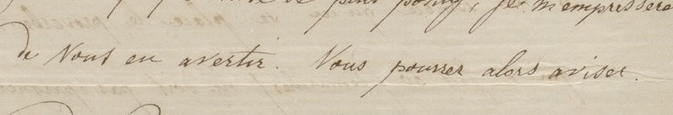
de Vous en avertir. Vous pourrez alors aviser.
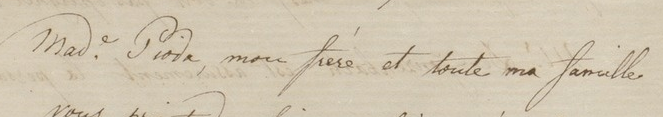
MadePioda, mon frère et toute ma famille
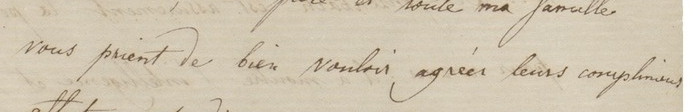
Vous prient de bien vouloir agréer leurs complimens
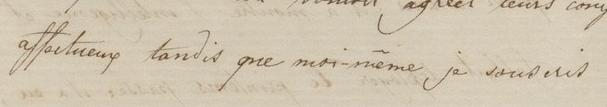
affectueux tandis que moi-même je souscris
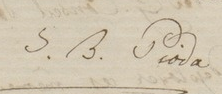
G. B. Pioda
